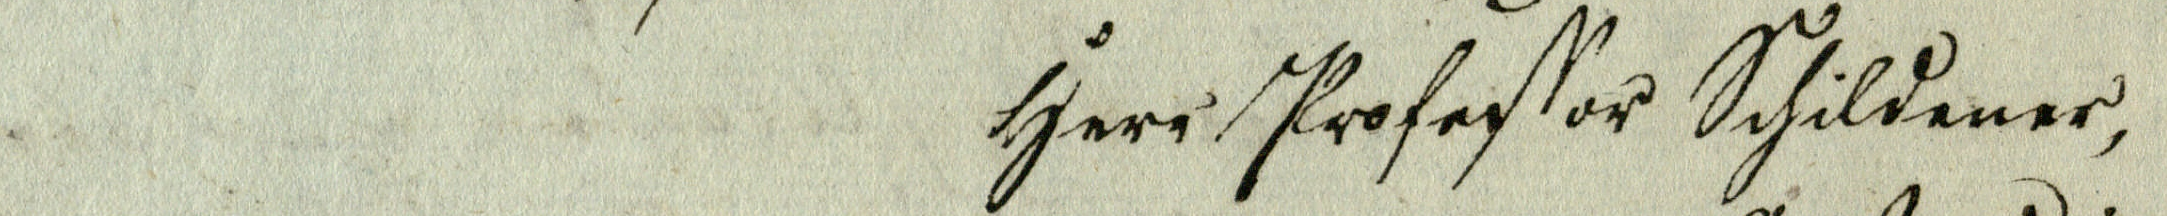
Herr Professor Schildener,
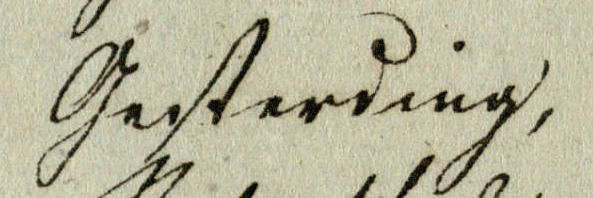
Gesterding,
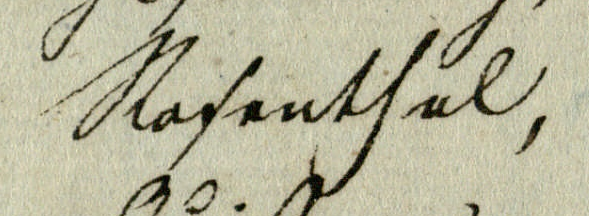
Rosenthal,
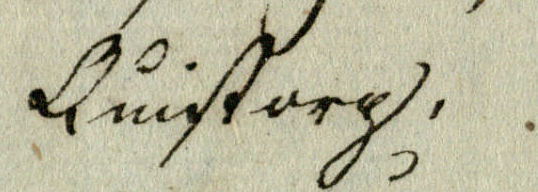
Quistorp,
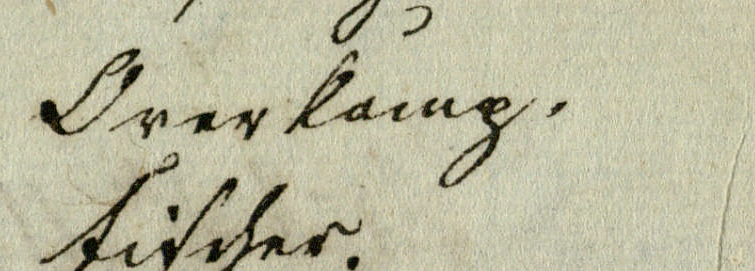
Overkamp,
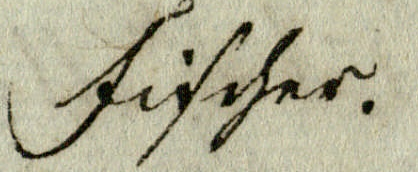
Fischer.
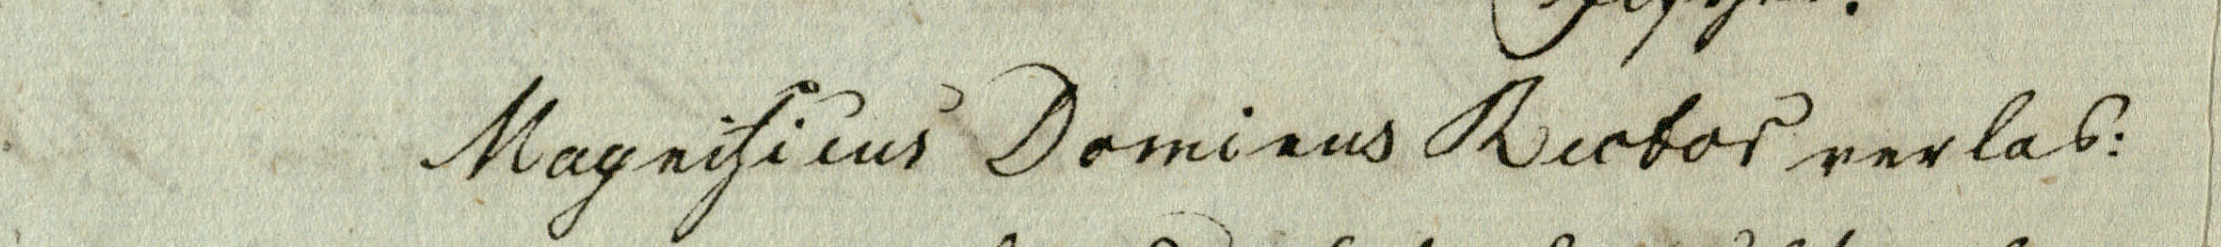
Magnificus Dominus Rector verlas:
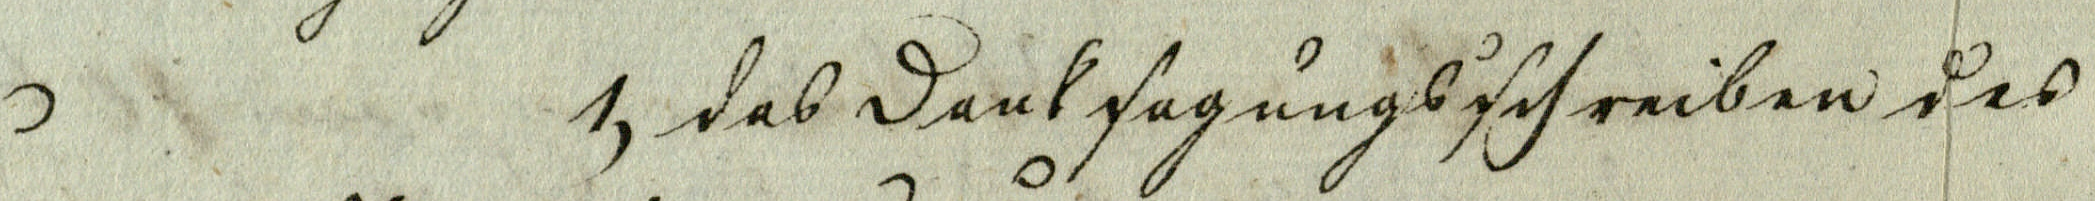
1, das Danksagungsschreiben des
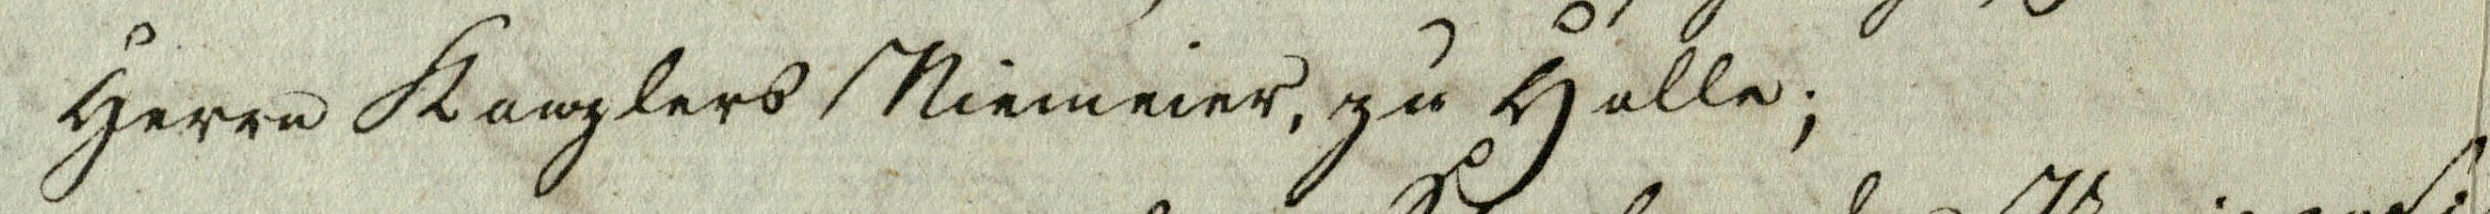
Herrn Kanzlers Niemer, zu Halle;
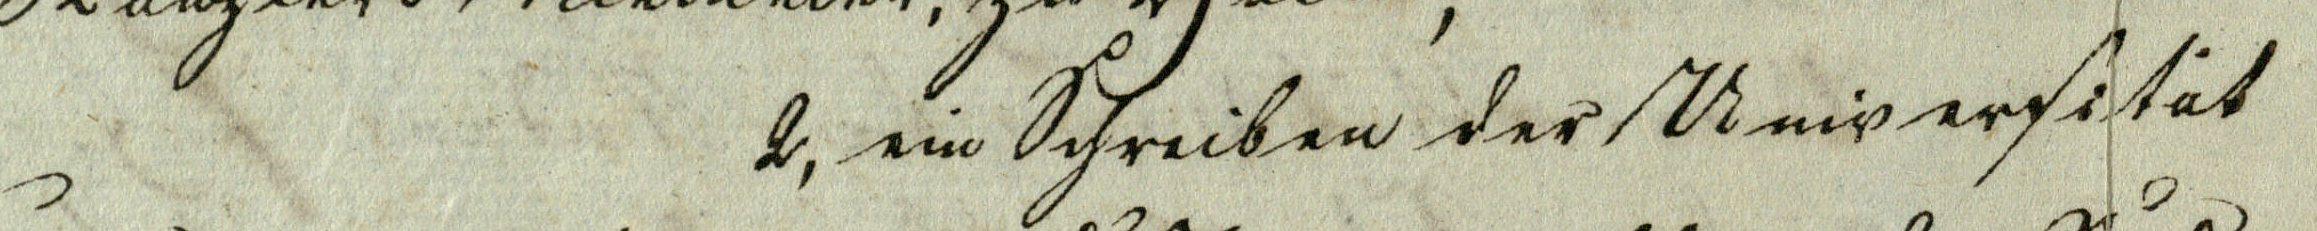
2, ein Schreiben der Universität
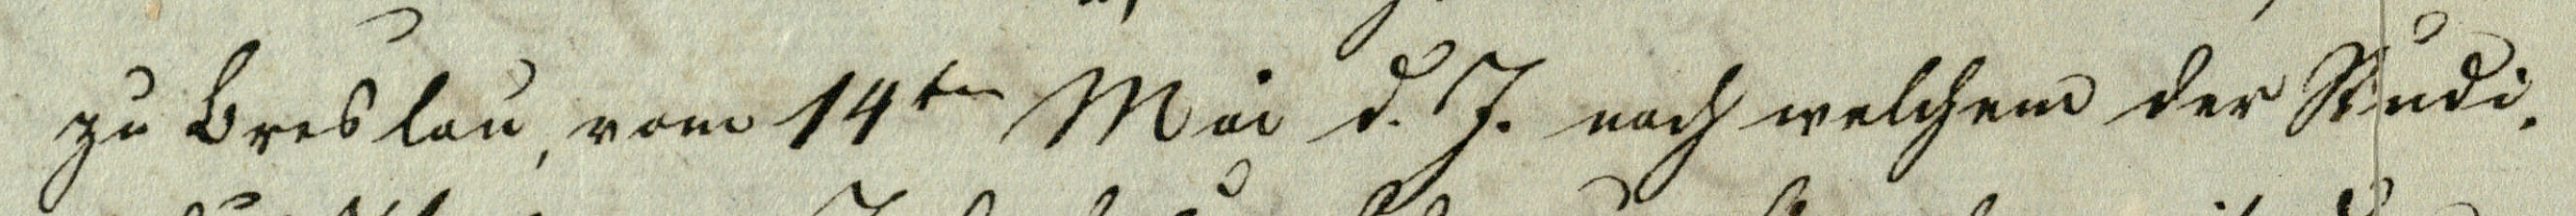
zu Breslau, vom 14ten Mai d. J. nach welchem der Studi¬
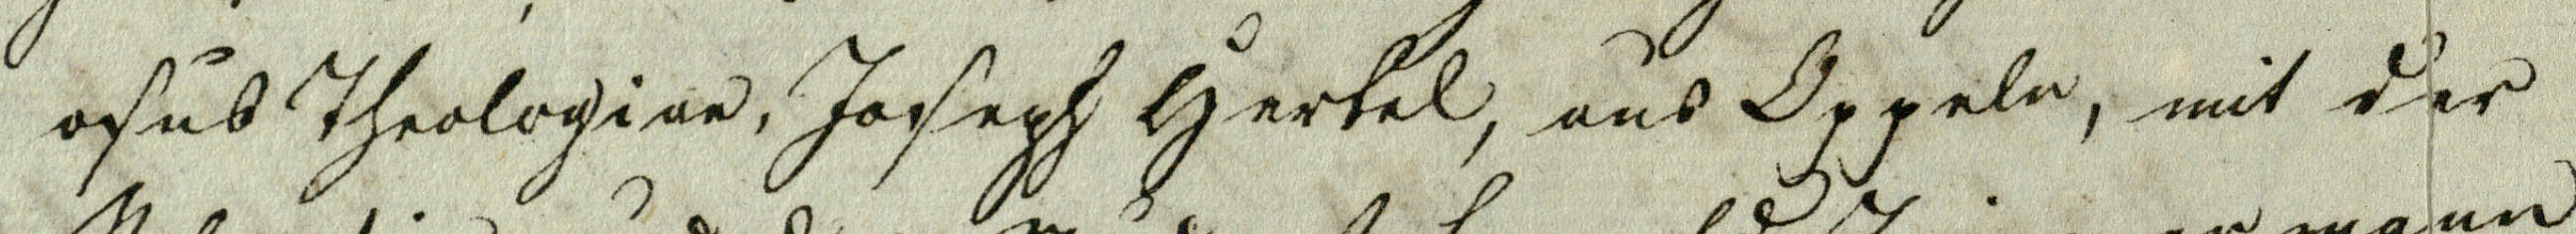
osus Theologiae, Joseph Hertel, aus Oppeln, mit der
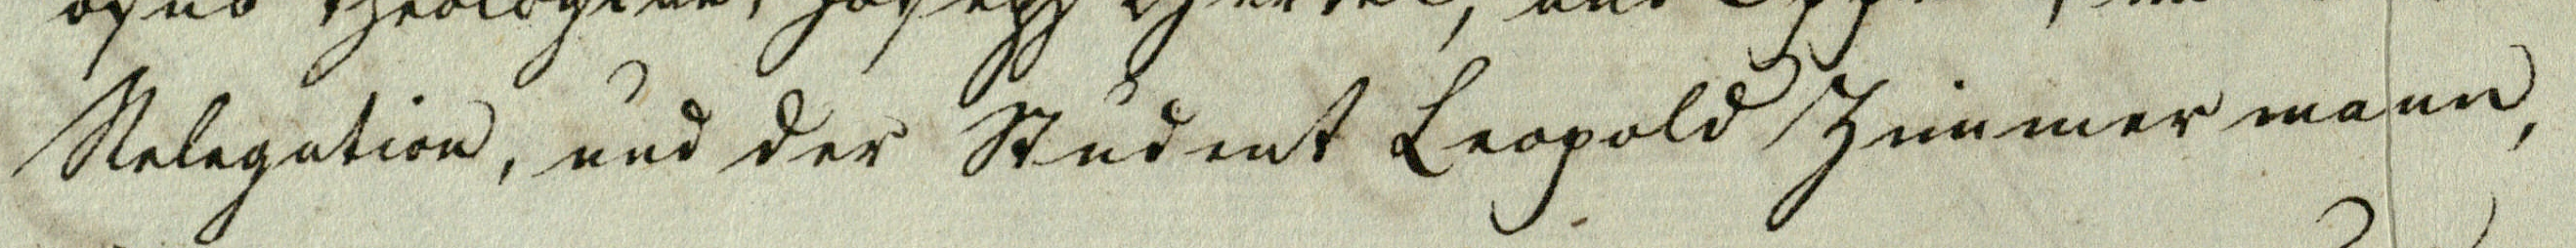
Relegation, und der Student Leopold Zimmermann,
